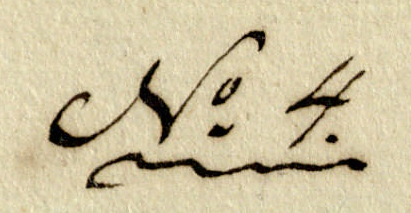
No 4.
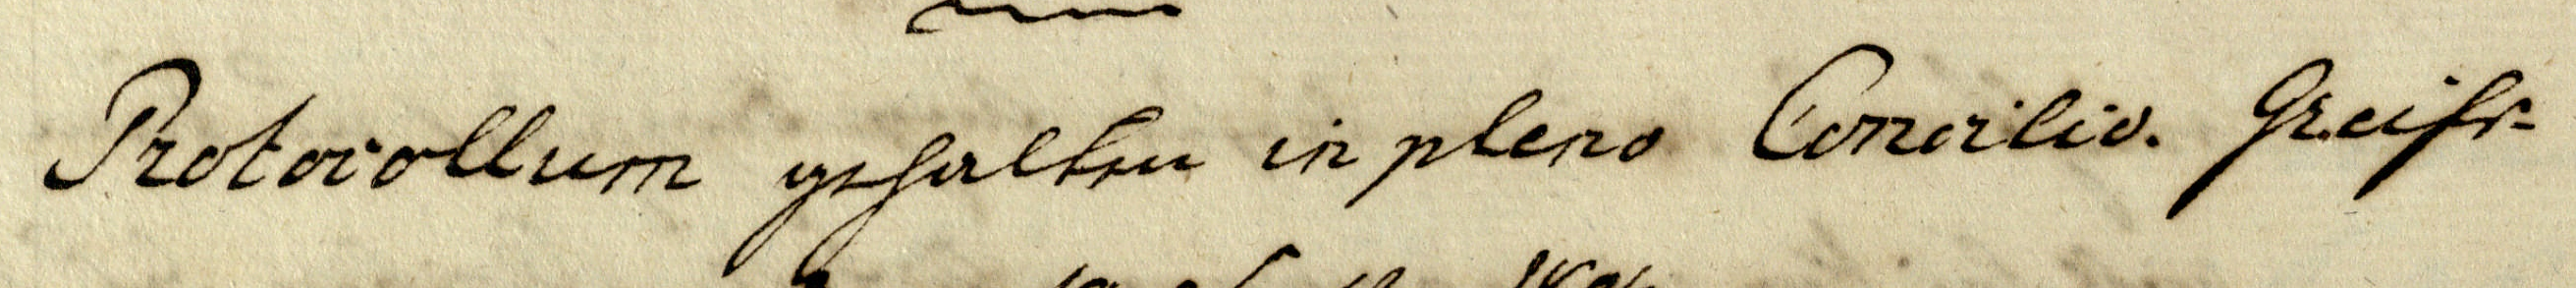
Protocollum gehalten in pleno Concilio. Greifs¬
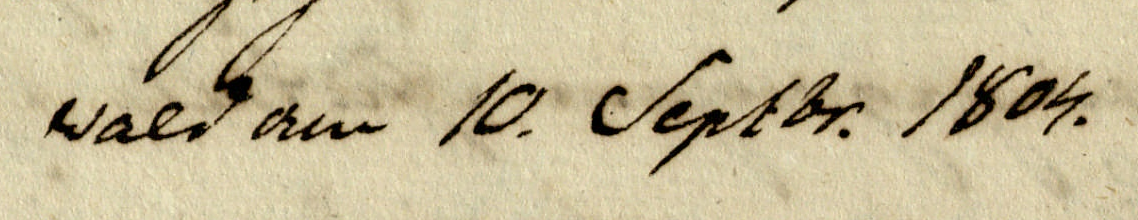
wald am 10. Septbr. 1804.
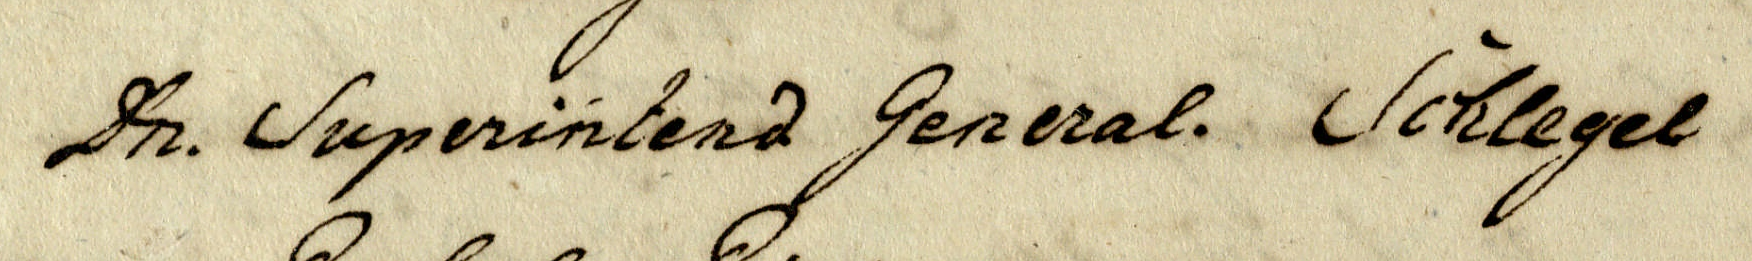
Dn. Superintend General. Schlegel
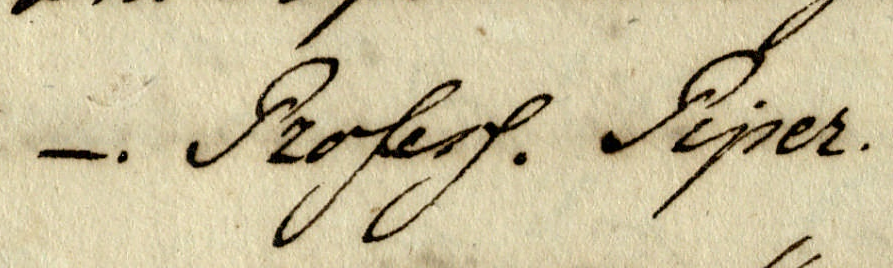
Profess. Piper.
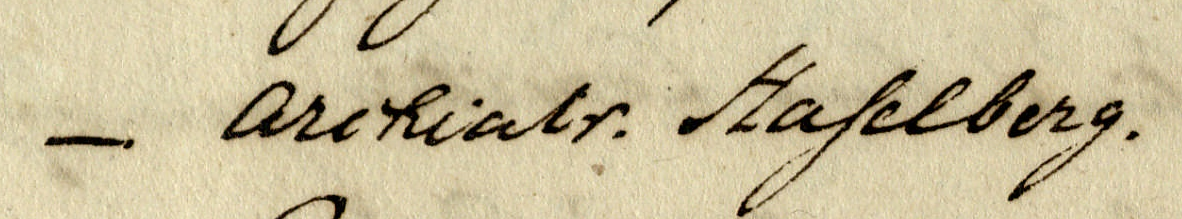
Archiatr. Haselberg.
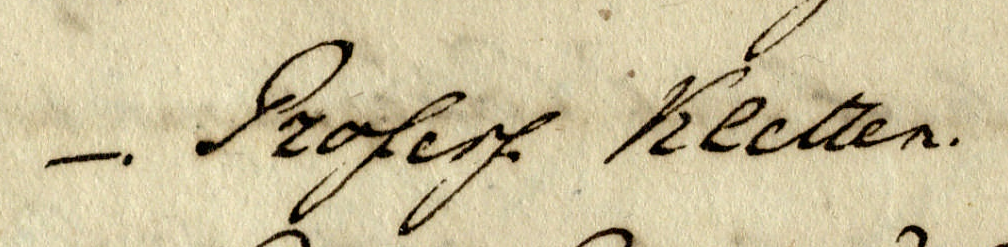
Profess. Kletten.
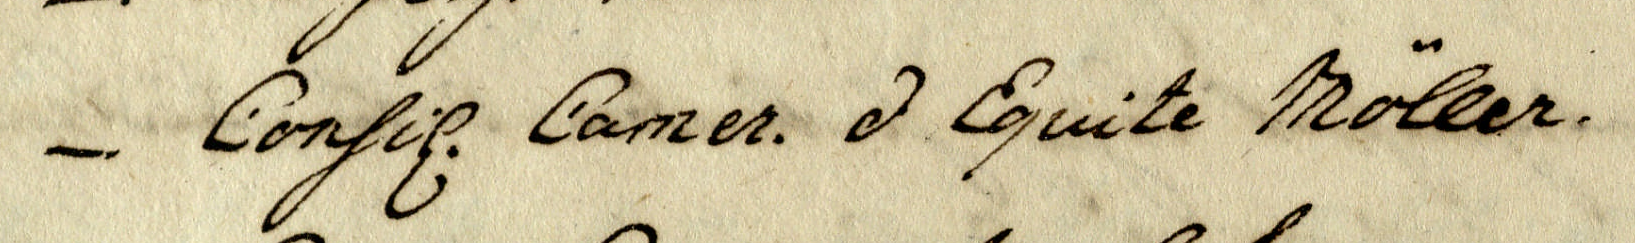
Consis. Camer. d Equite Möller.
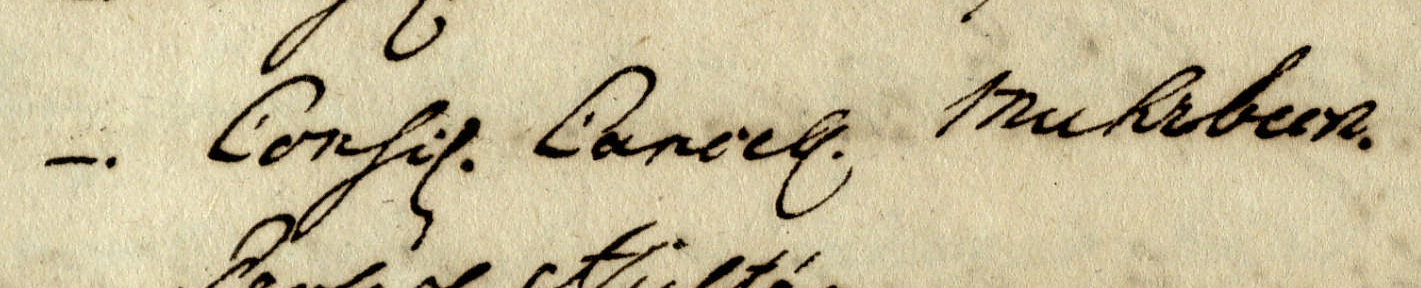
Consis. Cancell., Muhrbeck.
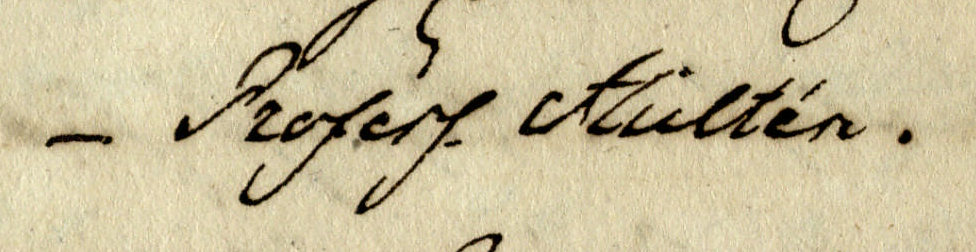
Profess. Hultén.
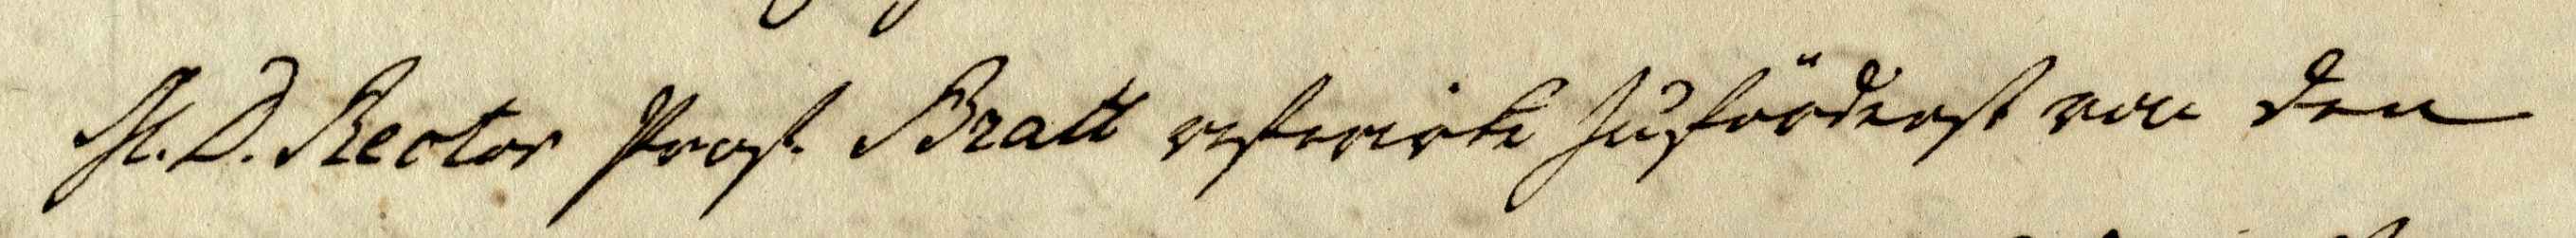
M. D. Rector Prof. Bratt referirte zuförderst von den
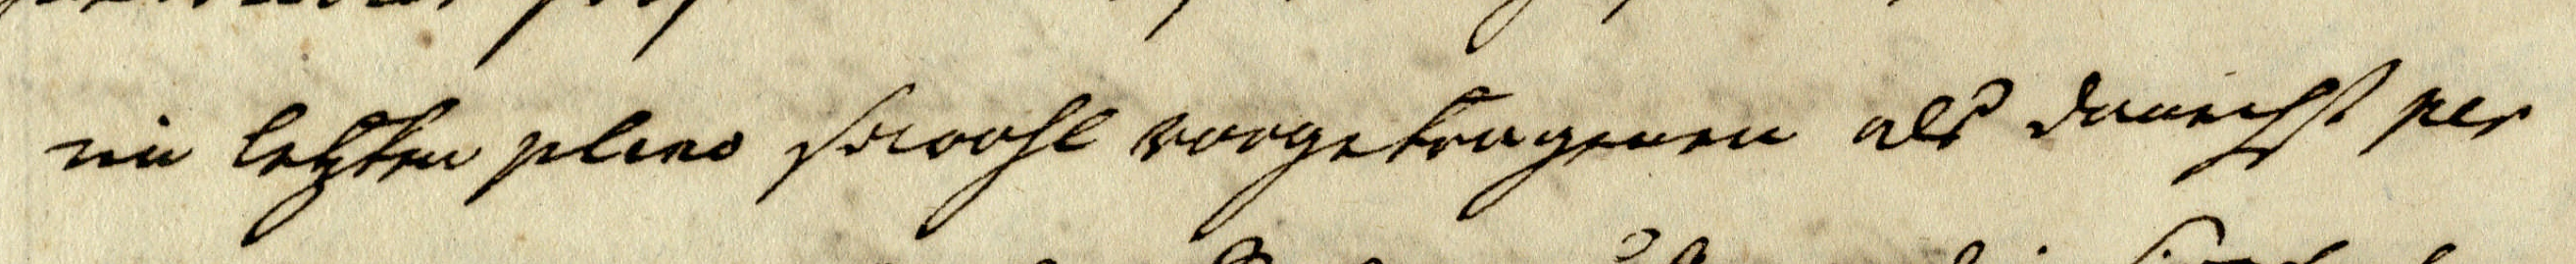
im letzten pleno sowohl vorgetragenen als danechst per
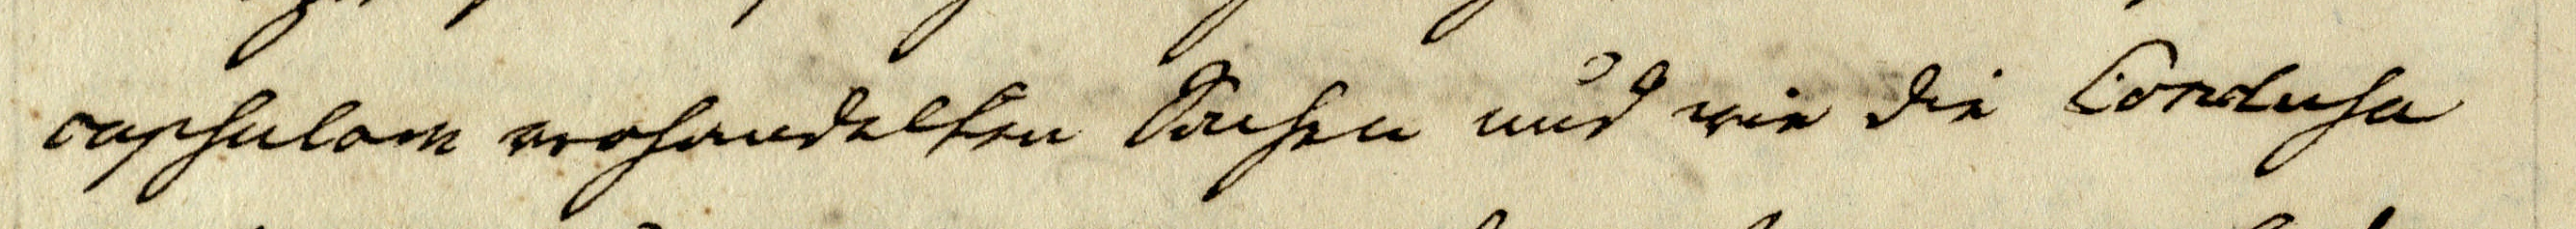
capsulam verhandelten Sachen und wie die Conclusa
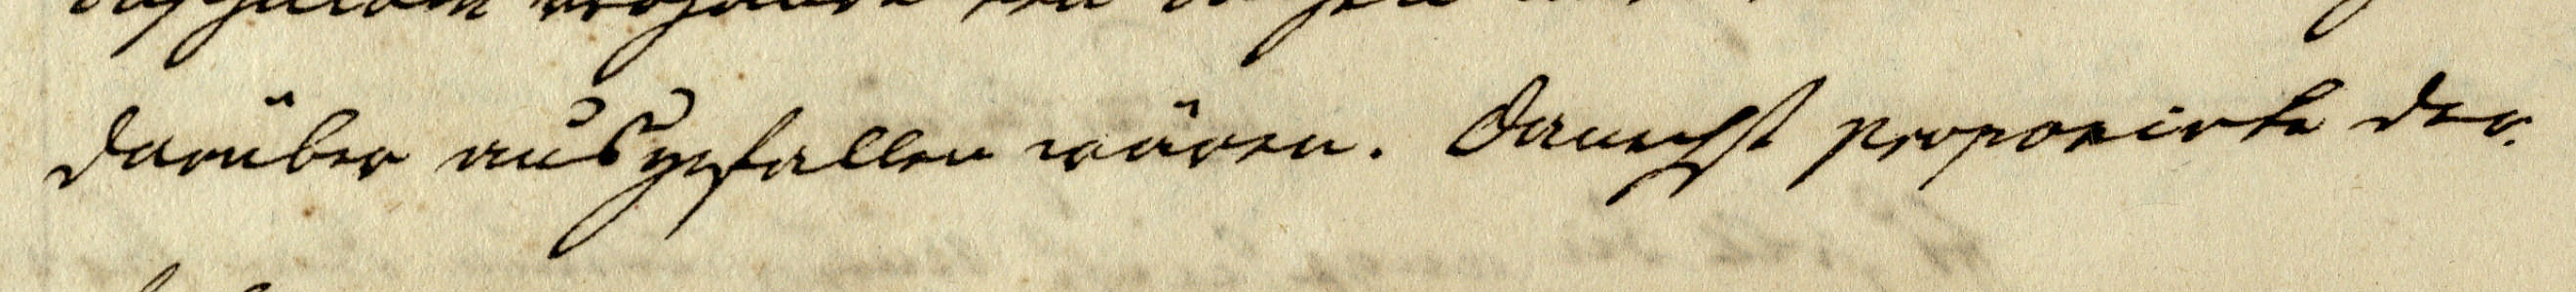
darüber ausgefallen wären. Danechst proponirte der¬
